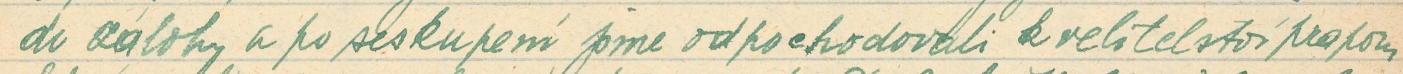do zálohy a po seskupení jsme odpochodovali k velitelství praporu
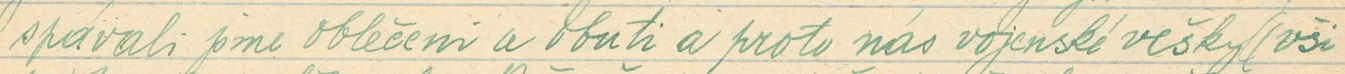spávali jsme oblečeni a obuti a proto nás vojenské vešky/vši
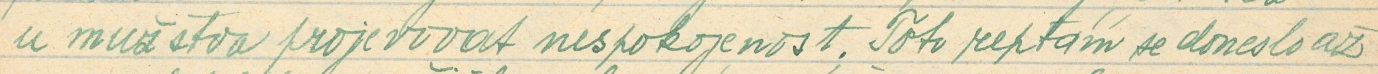u mužstva projevovat nespokojenost. Toto reptání se doneslo až
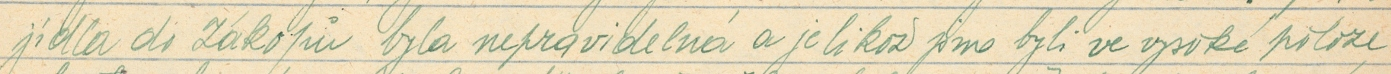jídla do zákopů byla nepravidelná a jelikož jsme byli ve vysoké poloze
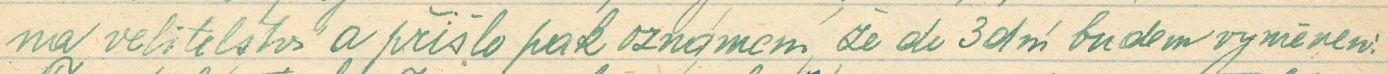na velitelství a přišlo pak oznámení, že do 3 dní budem vyměnení.
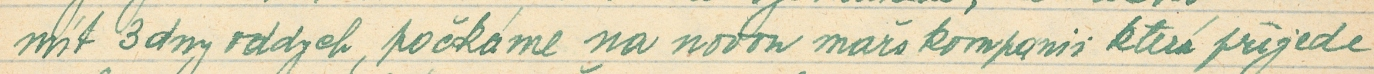mít 3 dny oddych, počkáme na novou marš kompanii která přijede
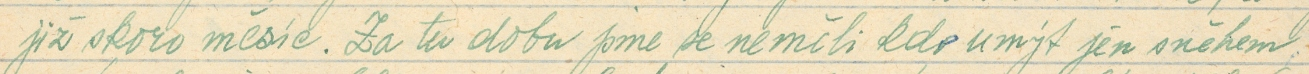již skoro měsíc. Za tu dobu jsme se neměli kdo umýt jen sněhem,
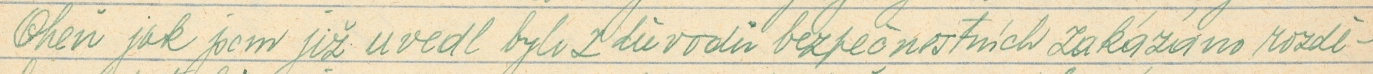Oheň jak jsem již uvedl bylo z důvodů bezpečnostních zakázáno rozdě-
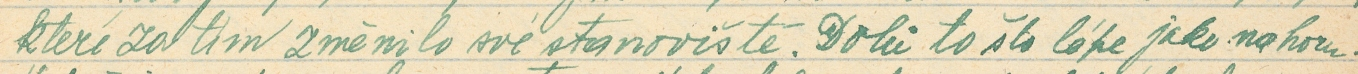které za tím změnilo své stanoviště. Dolů to šlo lépe jako nahoru.
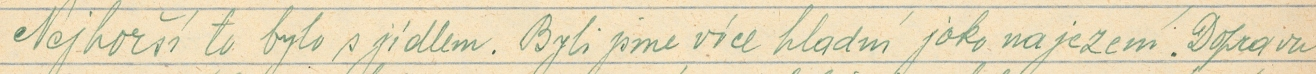Nejhorší to bylo s jídlem. Byli jsme více hladní jako najezení. Dopravu
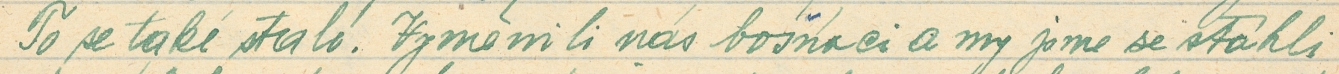To se také stalo. Vyměnili nás bosňáci a my jsme se stáhli
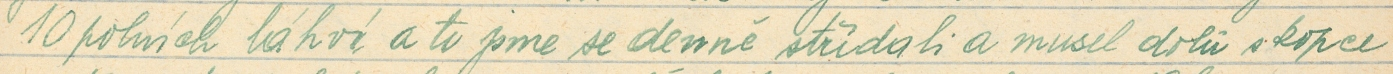10 polních láhví, a to jsme se denně střídali a musel dolů s kopce
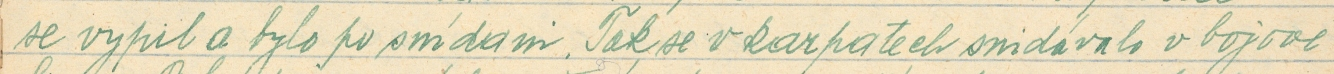se vypil a bylo po snídani. Tak se v karpatech snidávalo v bojové
